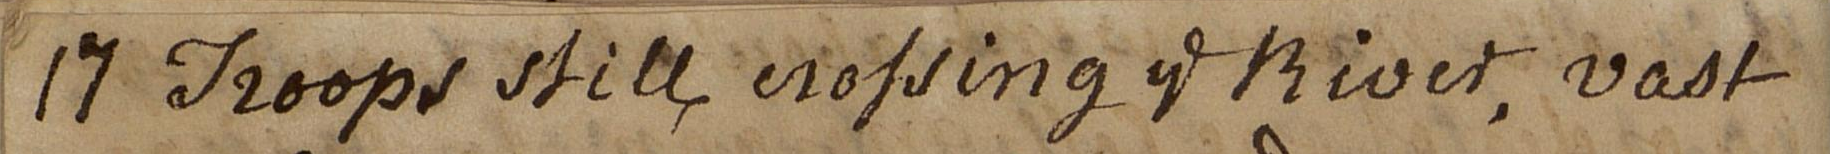17 Troops still crossing y^e River, vast
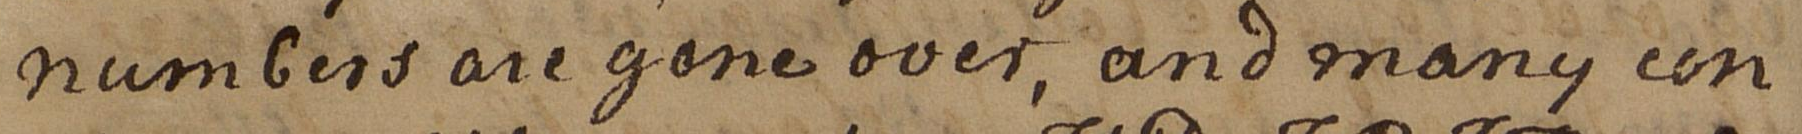numbers are gone over, and many con
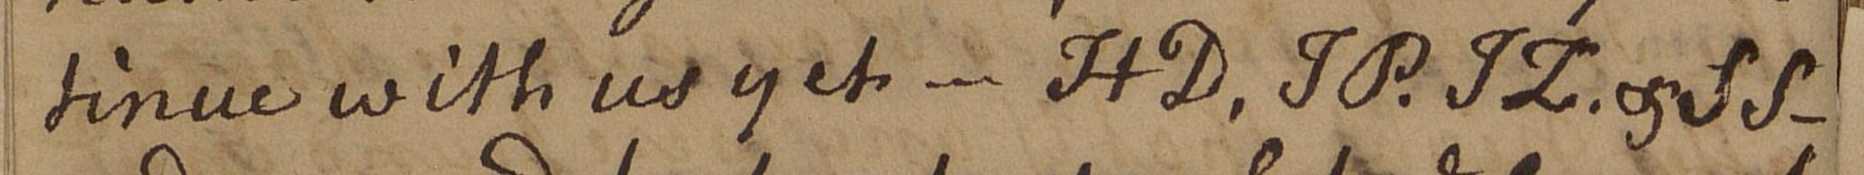tinue with us yet- H D, JP. IL. & SS-
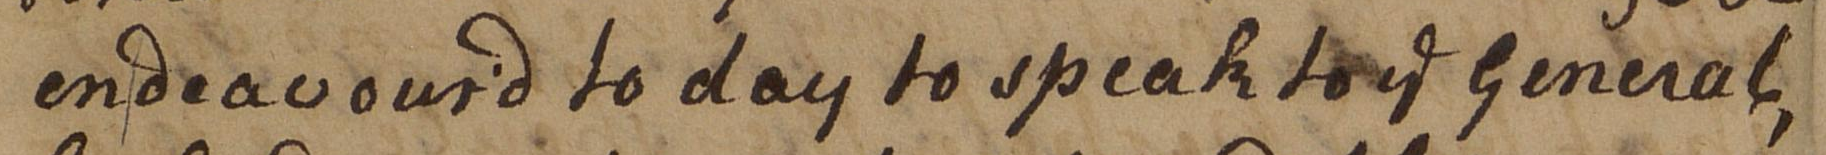endeavour'd to day to speak to y^e General,
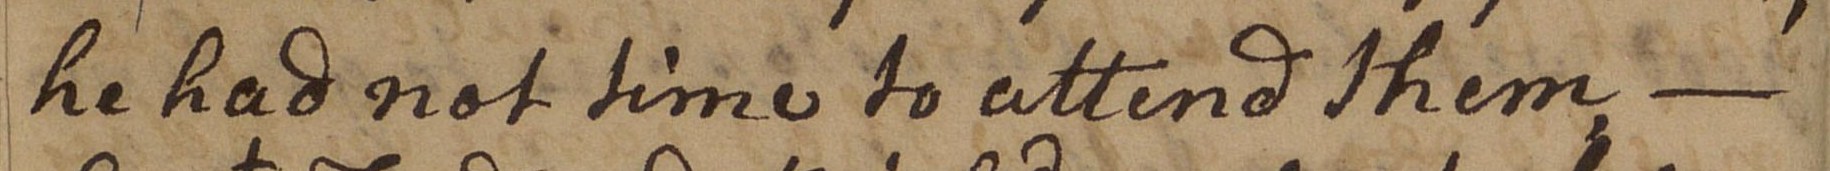he had not time to attend them,-
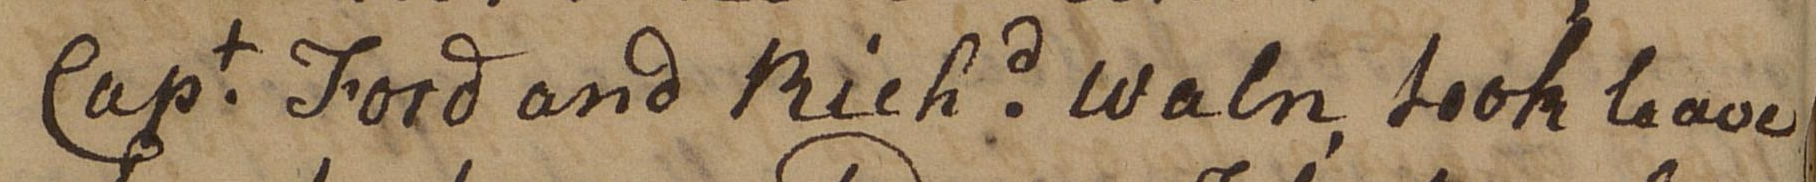Cap^t. Ford and Rich^d. Waln, took leave
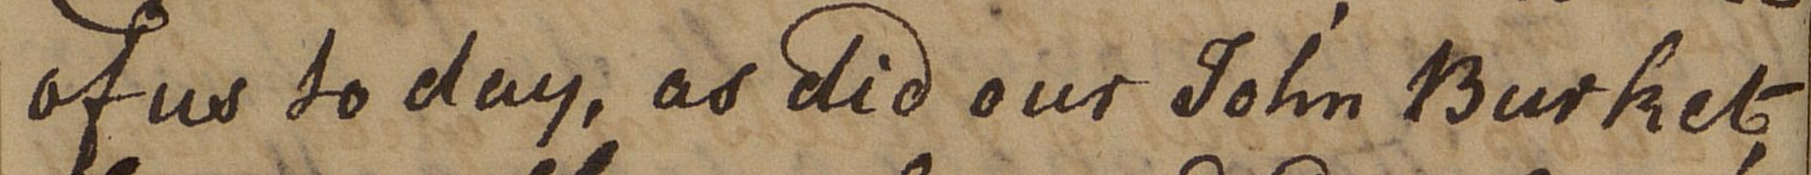of us to day, as did our John Burket,
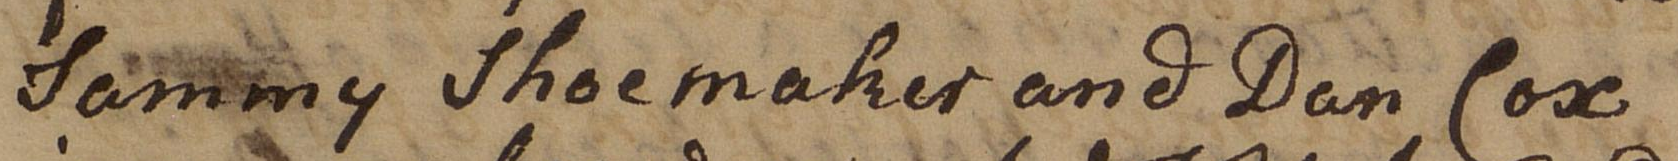Sammy Shoemaker and Dan Cox
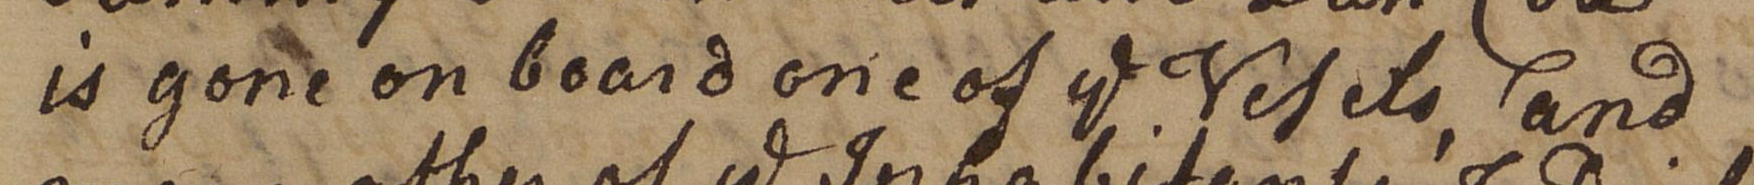is gone on board one of y^e Vesels, and
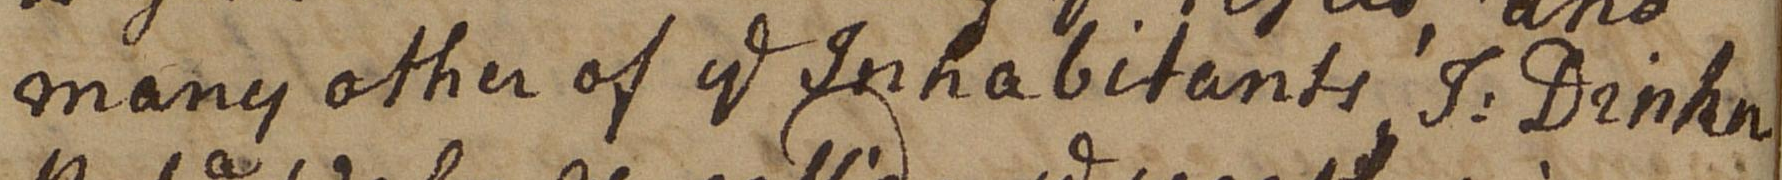many other of y^e Inhabitants J: Drinker
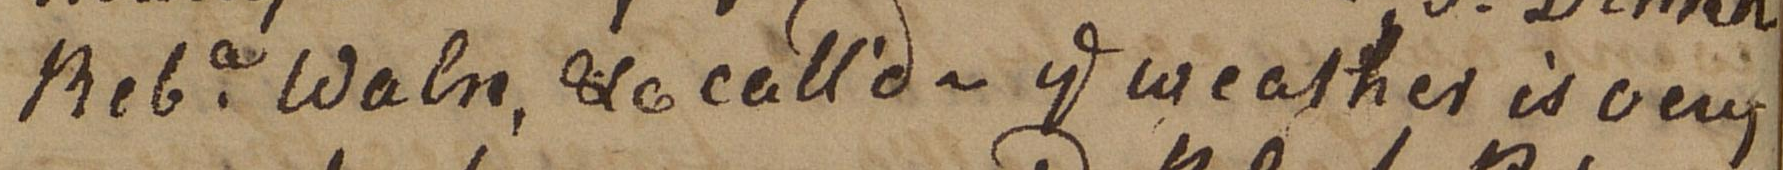Reb^a. Waln, &c call'd- y^e weather is very
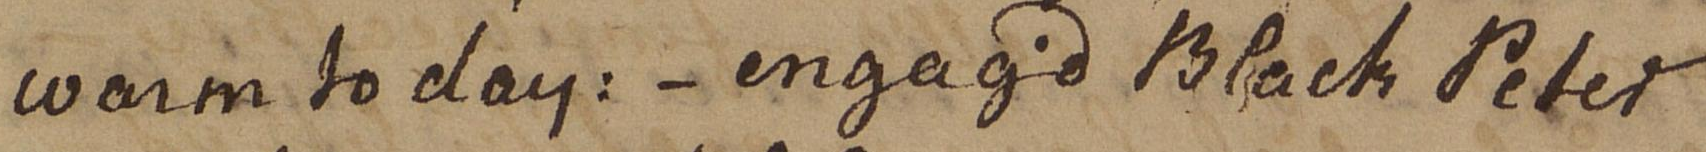warm to day:- engag'd Black Peter
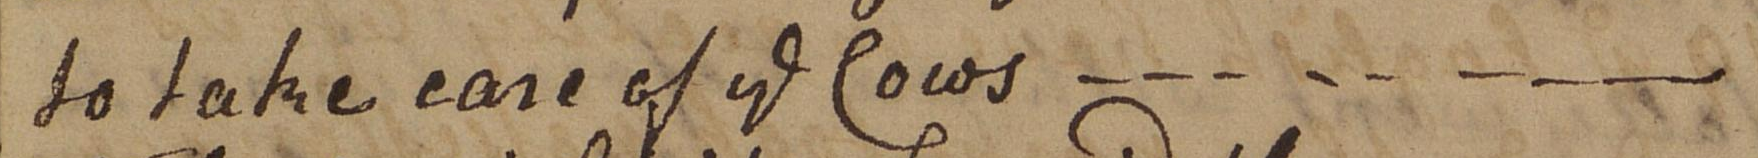to take care of y^e Cows------
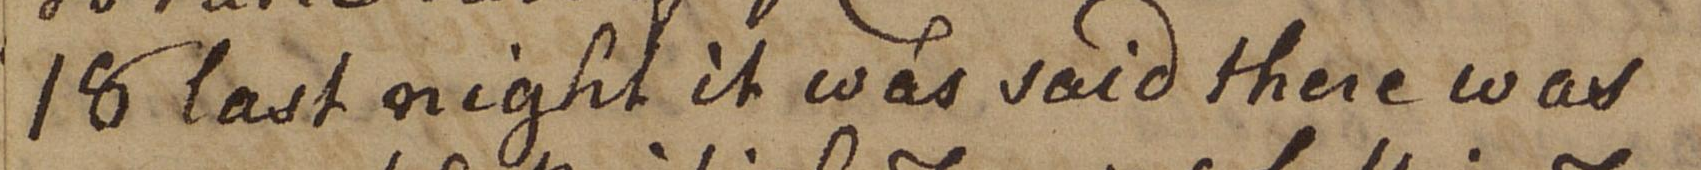18 last night it was said there was
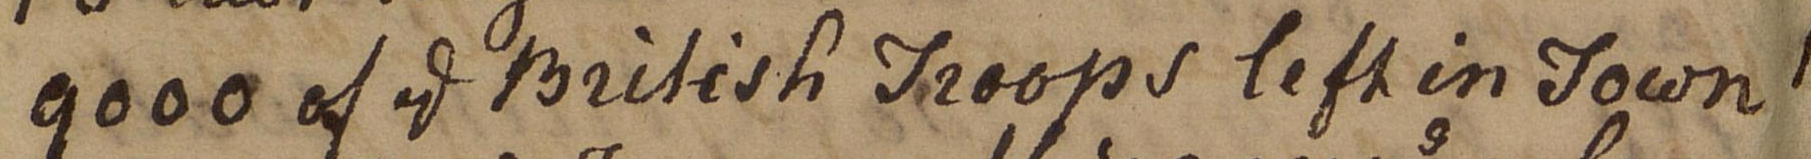9000 of y^e British Troops left in Town
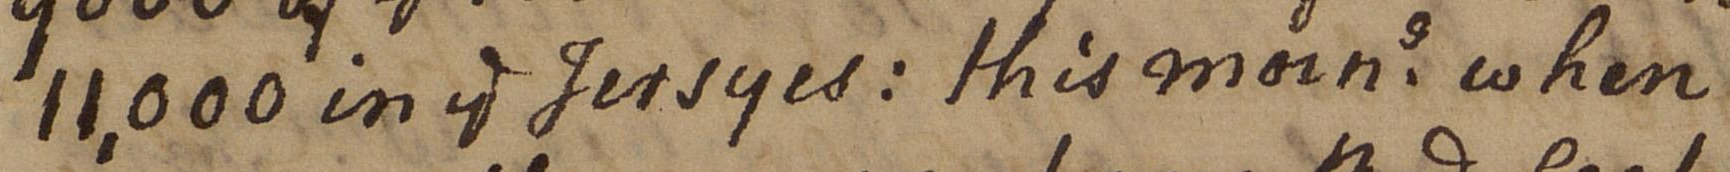11,000 in y^e Jersyes: this morn^g. when
